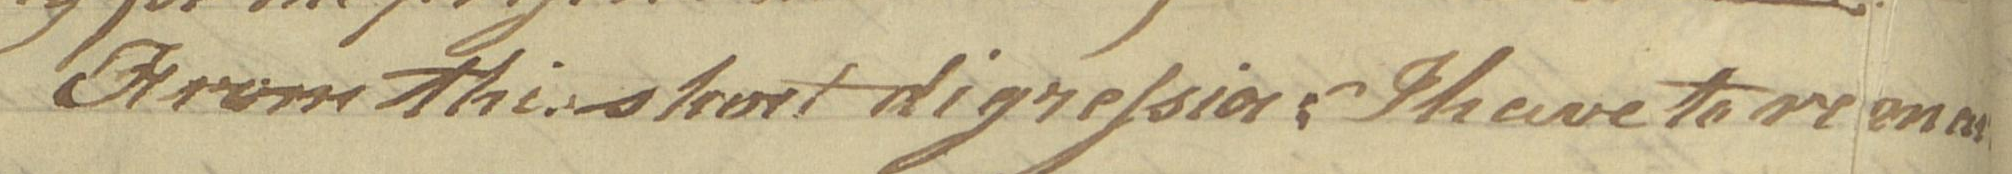From this short digression I have to remain
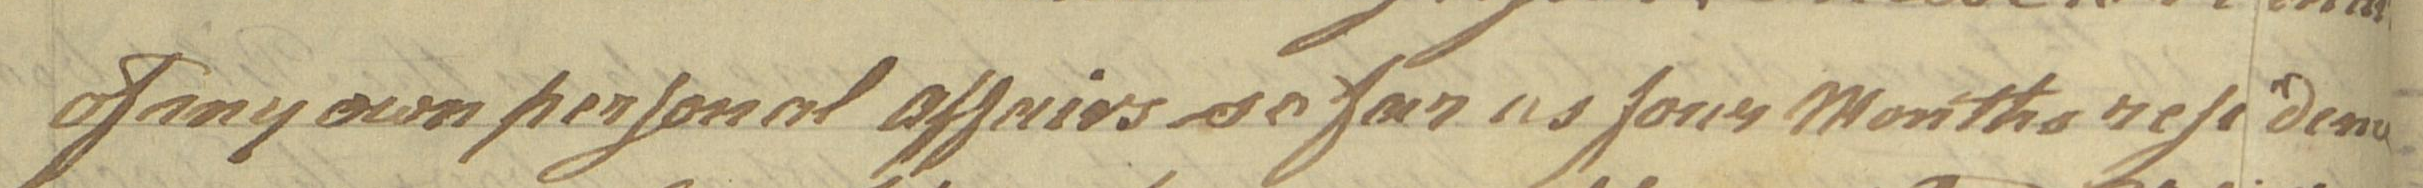of my own personal affairs so far as four Months residence
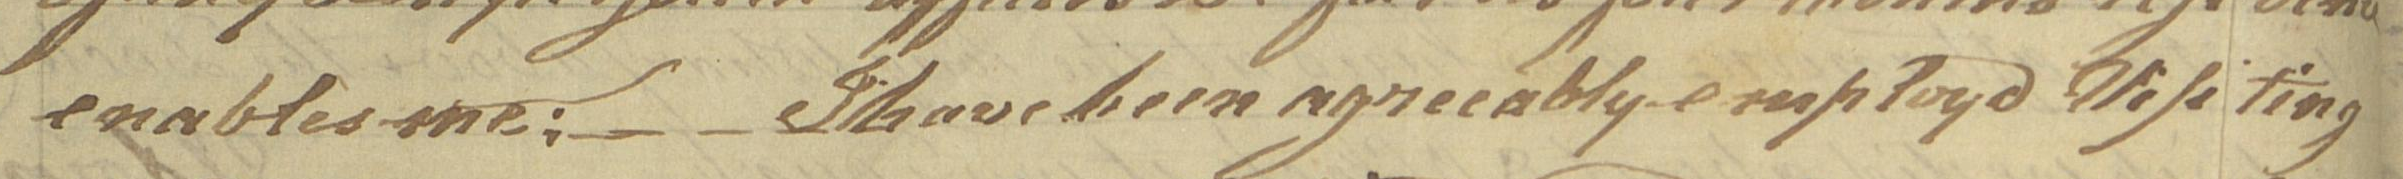enables me: I have been agreeably employd Assisting
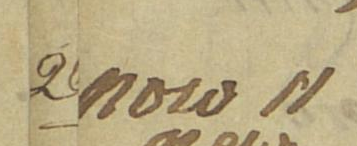now 11
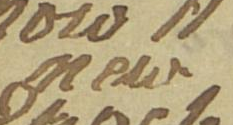new
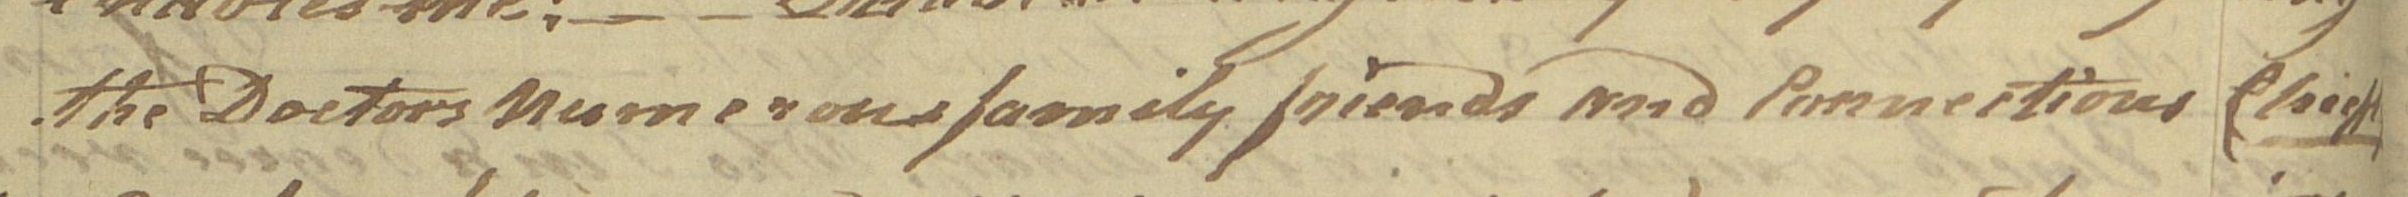the Doctors numerous family friends and Connections Chiefly
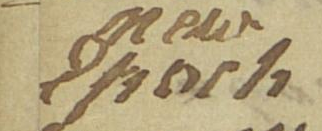Epoch
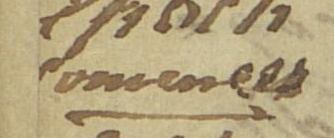oneself
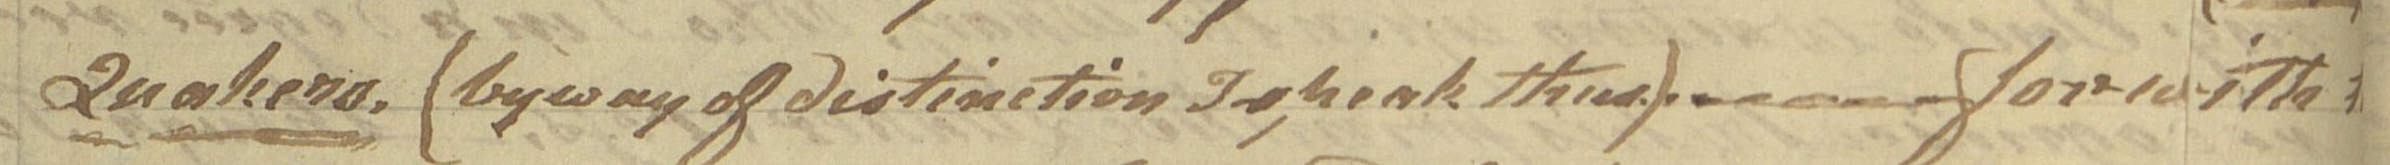Quakers. (by way of distinction I speak thus.) for with
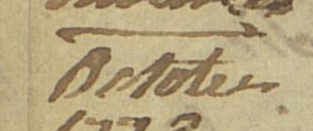October
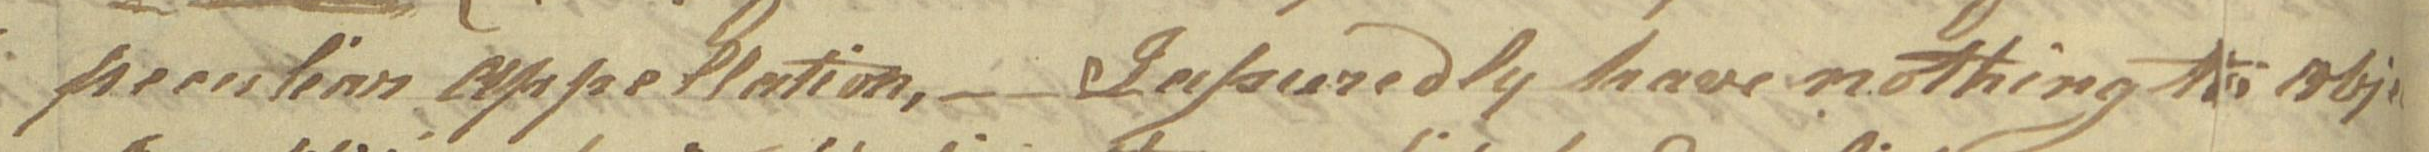peculiar appellation, I assuredly have nothing to obj-
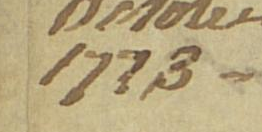1773
